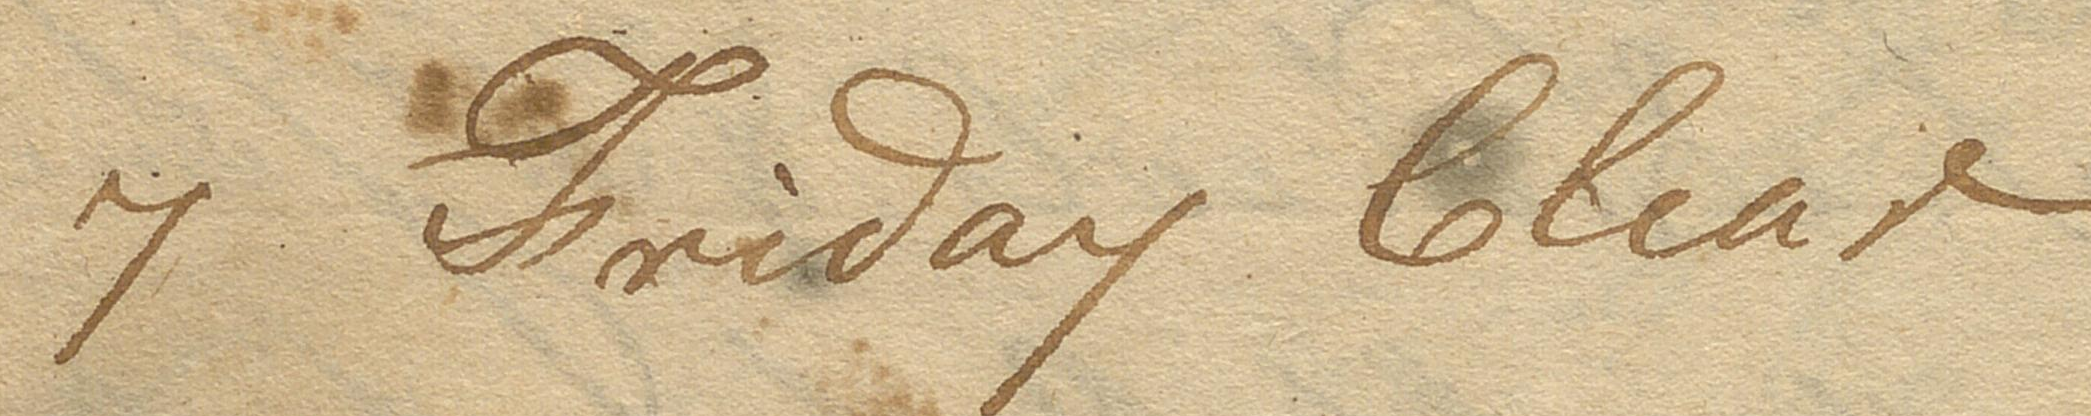7 Friday Clear
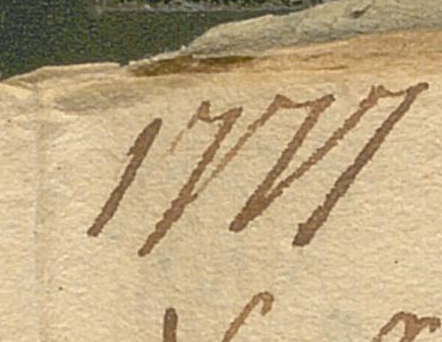1777
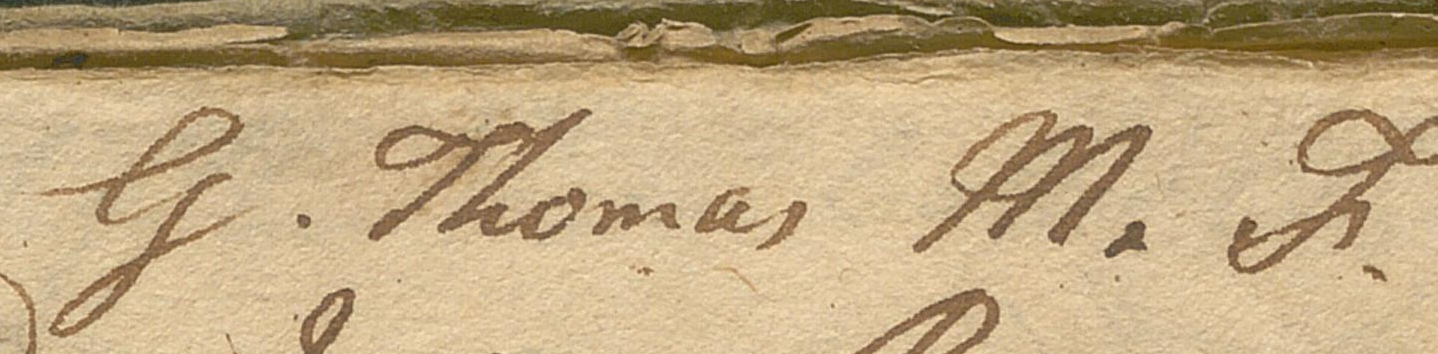G. Thomas M. F.
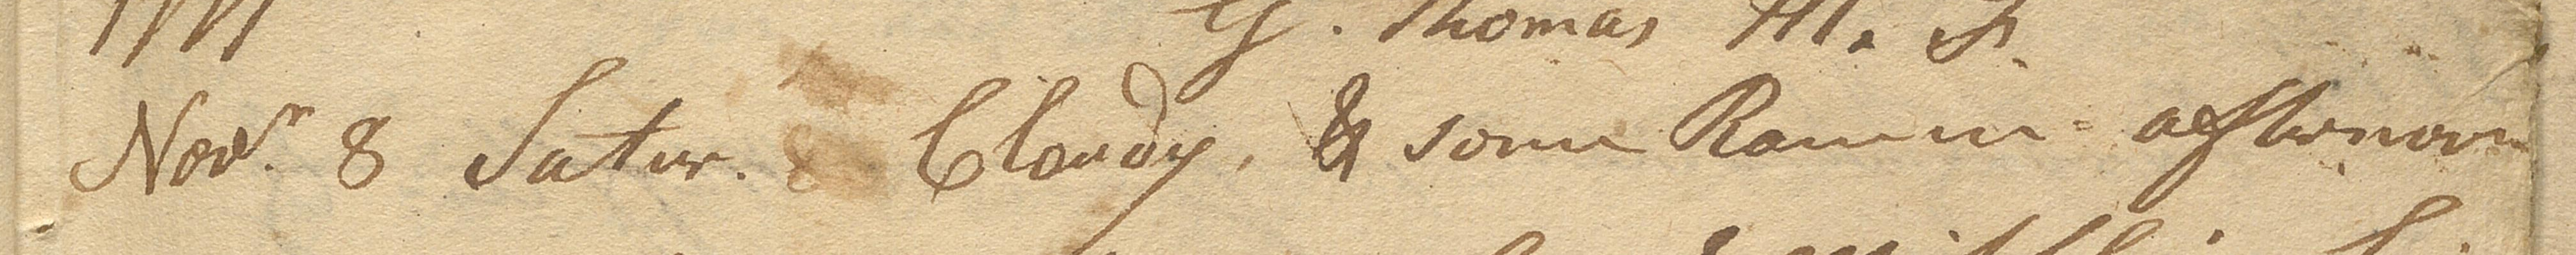Nov^r. 8 Satur. Cloudy, & some Rain in afternoon
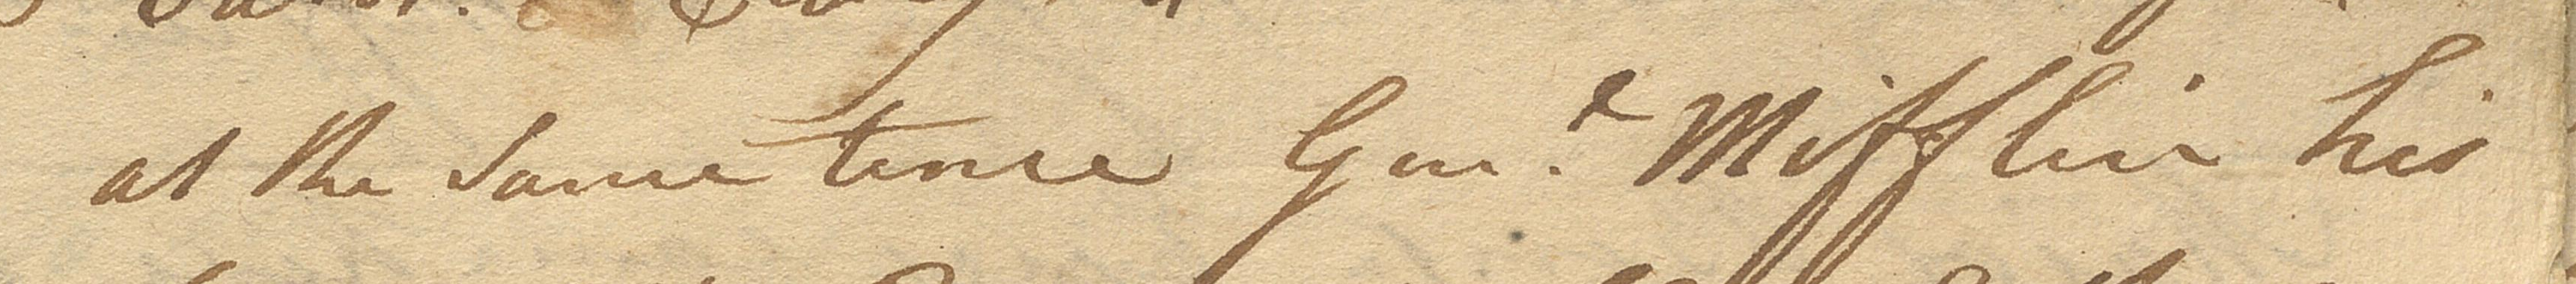at the same tine Gen^l. Mifflin his
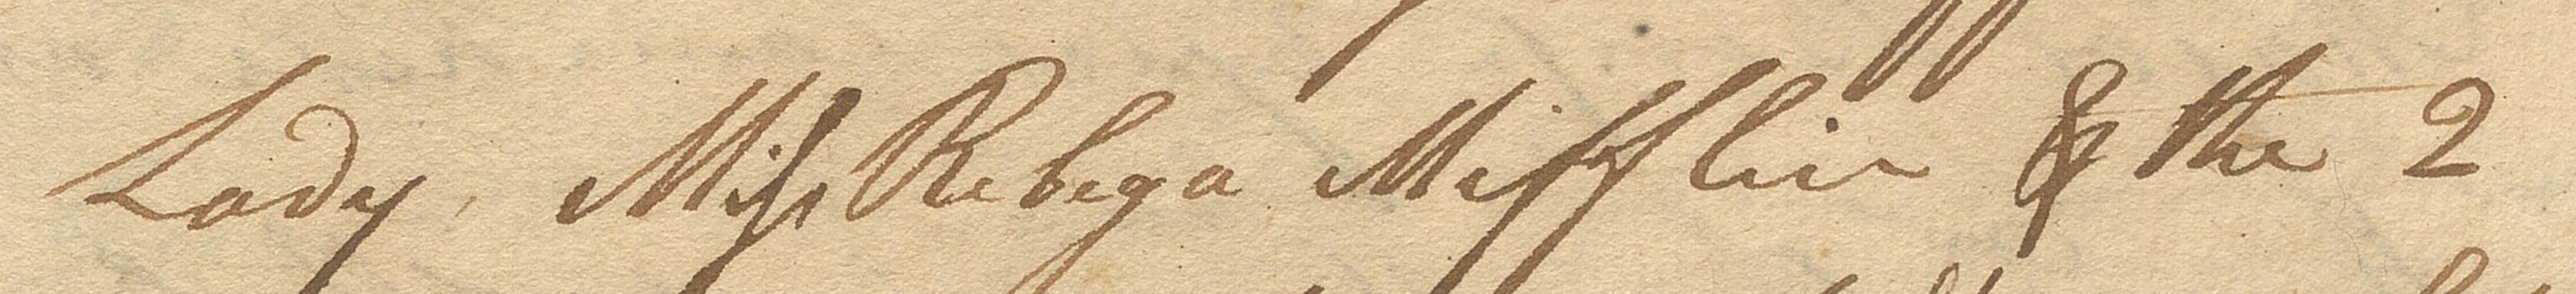Lady, Miss Rebega Mifflin & the 2
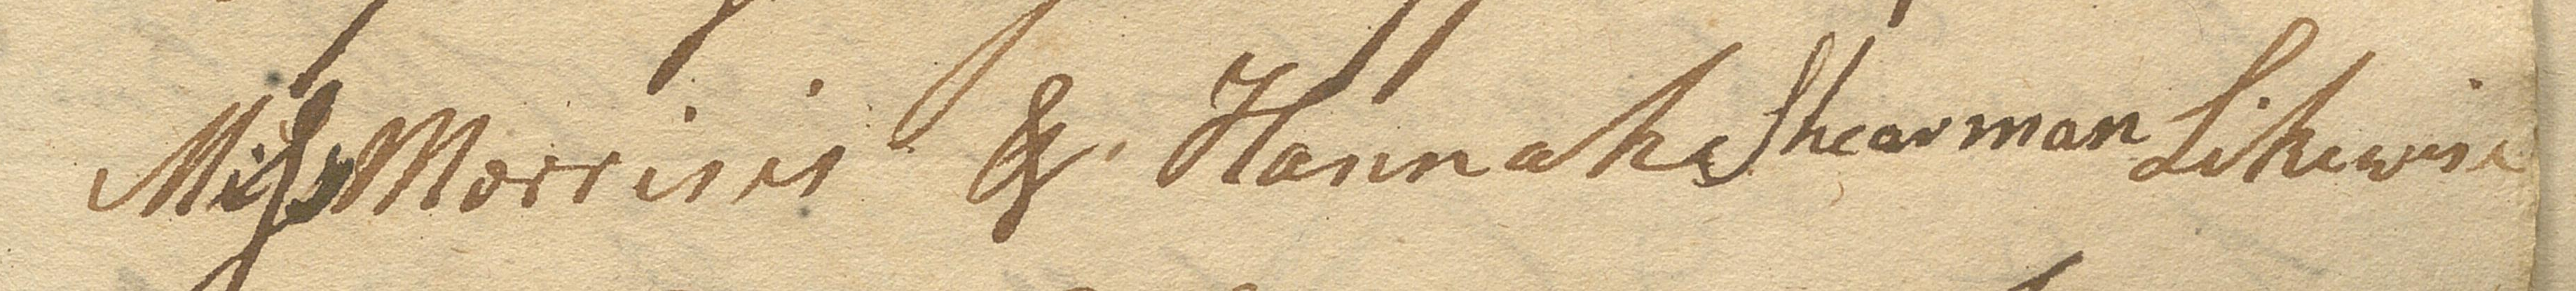Miss Morrisis & Hannah Shearman Likewise
